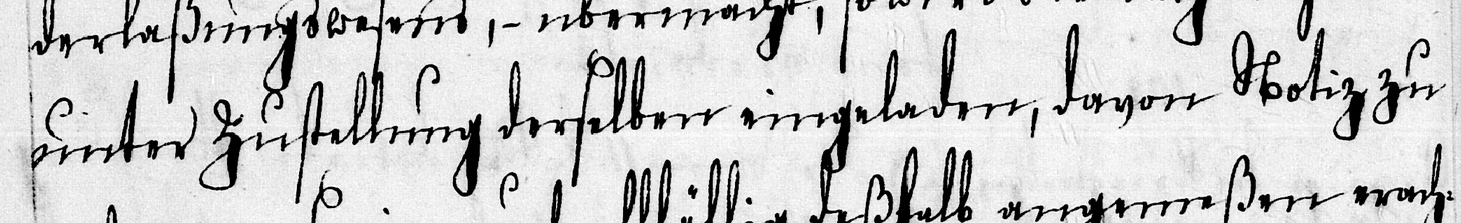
unter Zustellung derselben eingeladen, davon Notiz zu
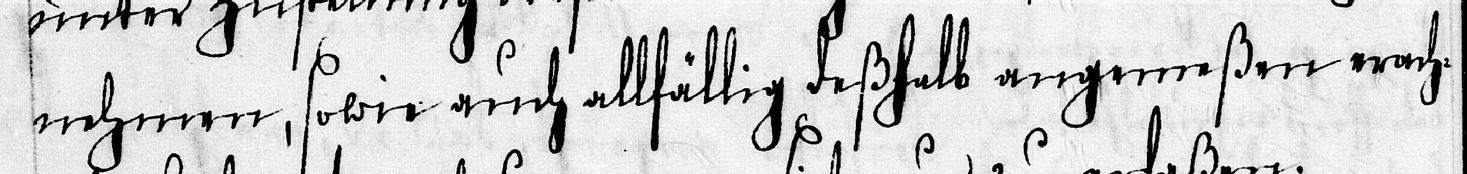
nehmen, sowie auch allfällig deßhalb angemeßen erach¬
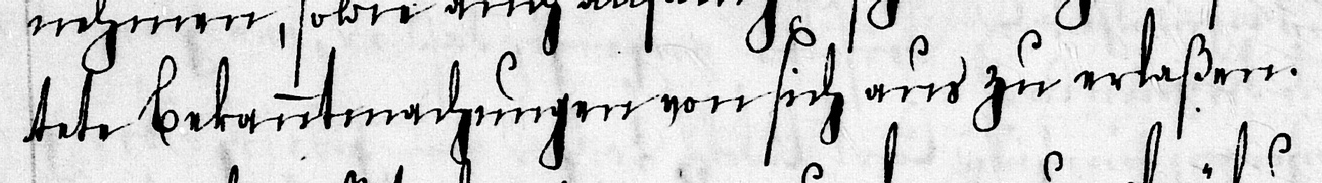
tete Bekanntmachungen von sich aus zu erlaßen.
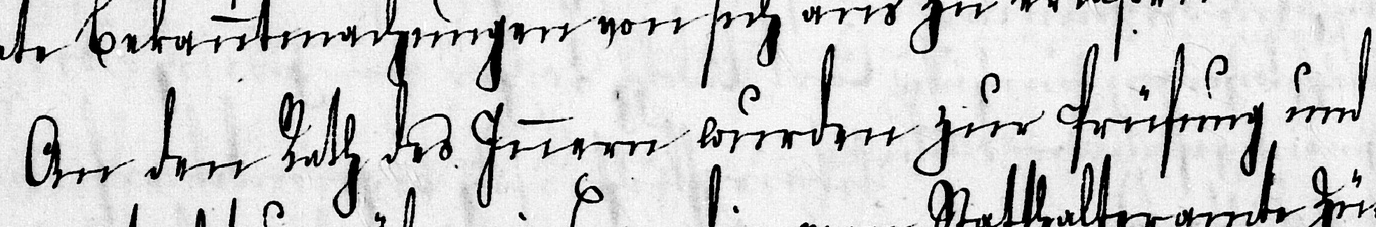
An den Rathe des Innern wurden zur Prüfung und
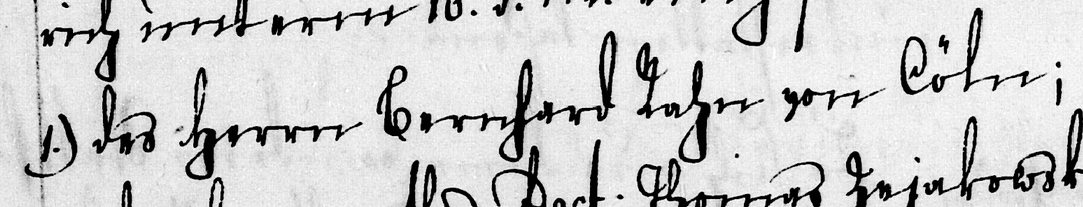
1.) des Herrn Bernhard Rahn von Cöln;
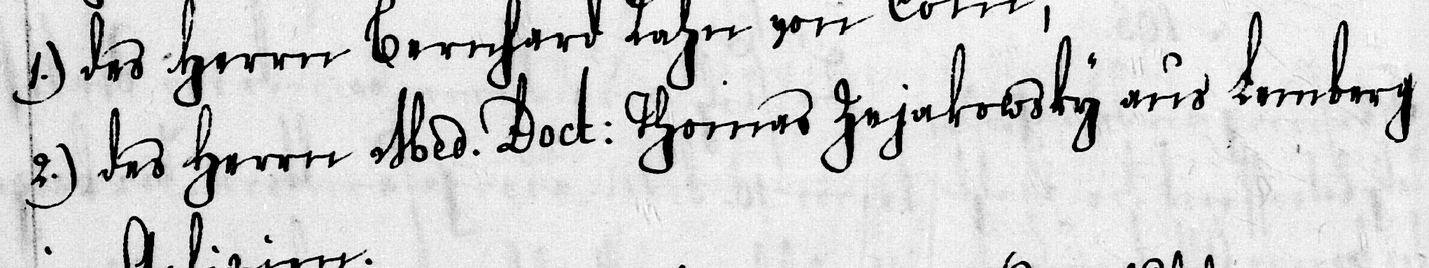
2.) des Herrn Med. Doct: Thomas Zejakowsky aus Lemberg
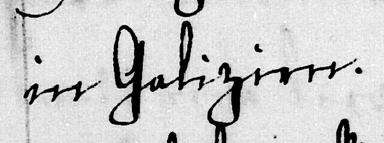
in Galizien.
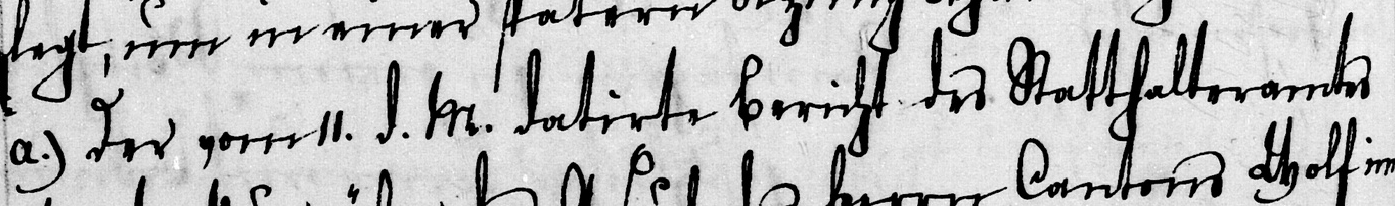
a.) Der vom 11. d. M. datirte Bericht des Statthalteramtes
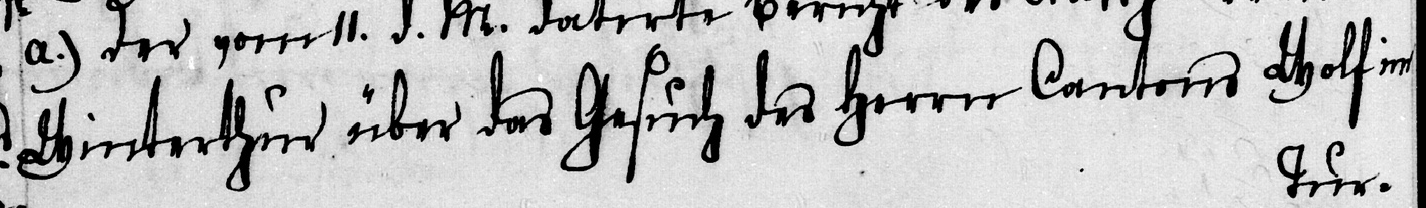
Winterthur über das Gesuch des Herrn Cantons Wolf im
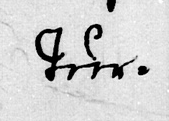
Zü¬
